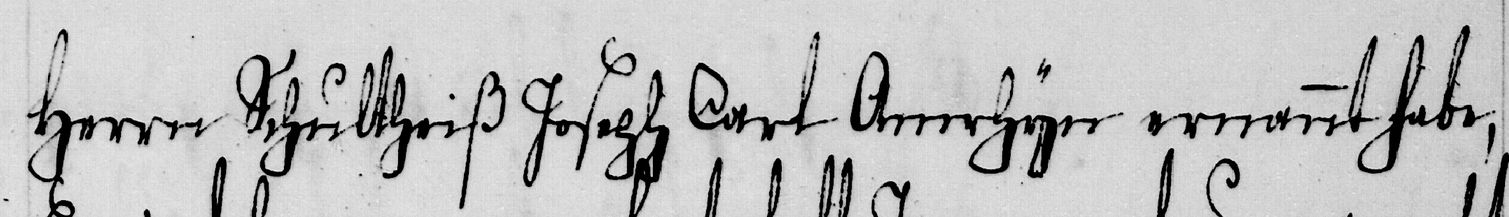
Herrn Schultheiß Joseph Carl Amrhyn ernannt habe,
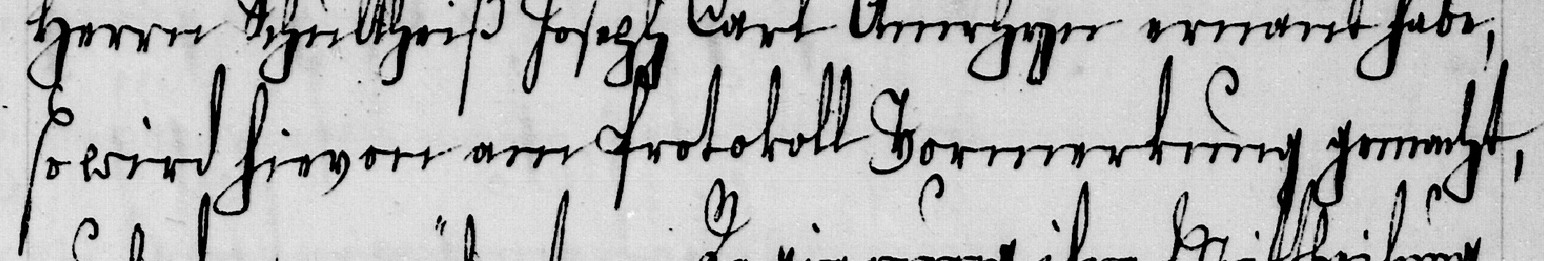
so wird hievon am Protokoll Vormerkung gemacht,
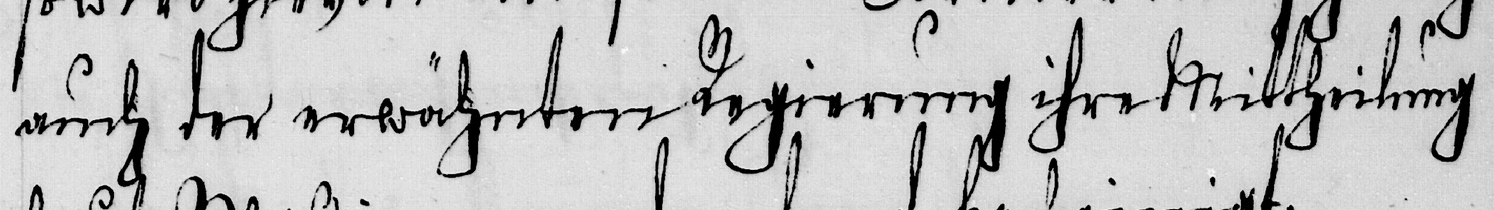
auch der erwähnten Regierung ihre Mittheilung
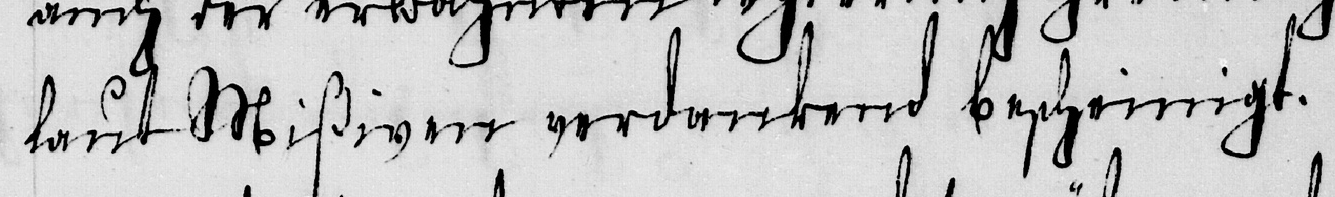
laut Mißiven verdankend bescheinigt.
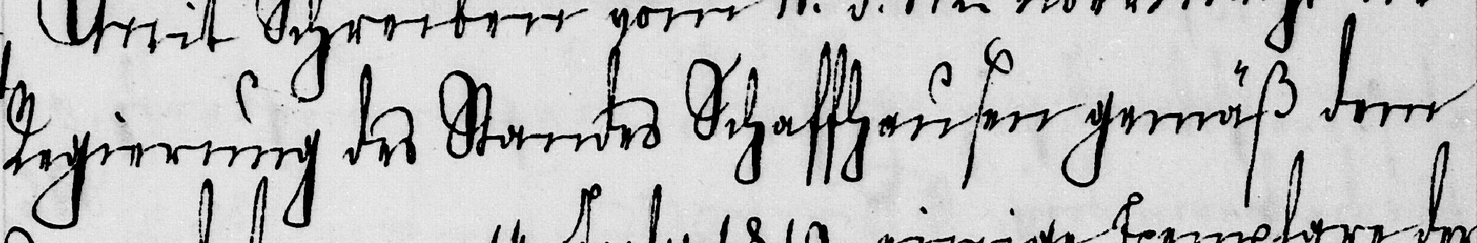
Regierung des Standes Schaffhausen gemäß dem
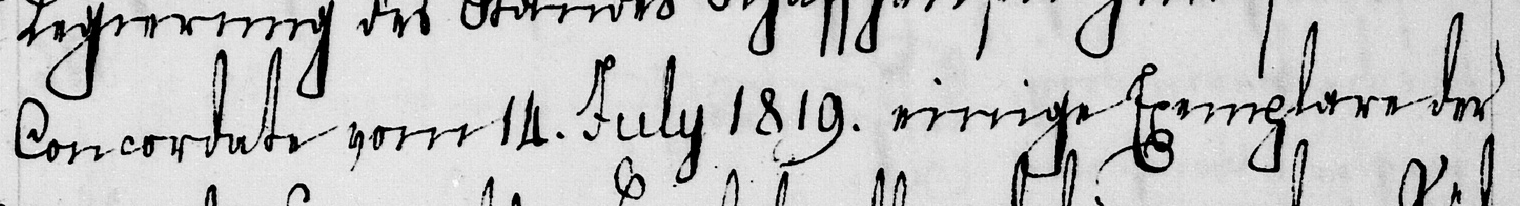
Concordate vom 14. July 1819. einige Exemplare der
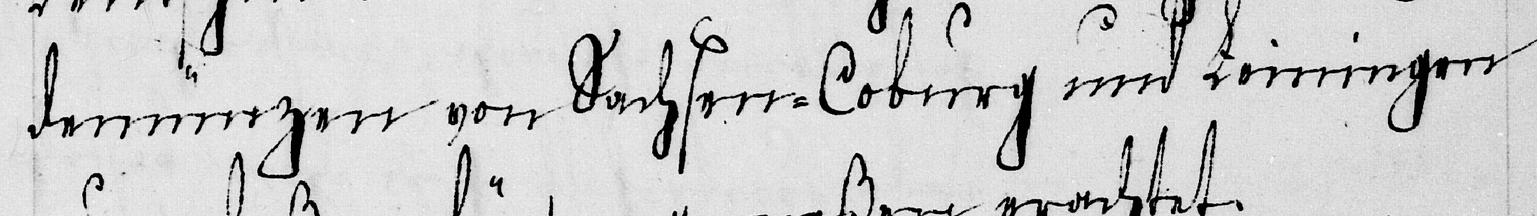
demünzen von Sachsen-Coburg und Leiningen
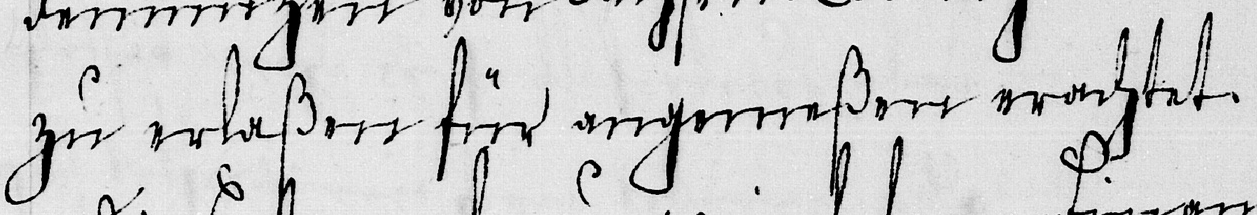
zu erlaßen für angemeßen erachtet.
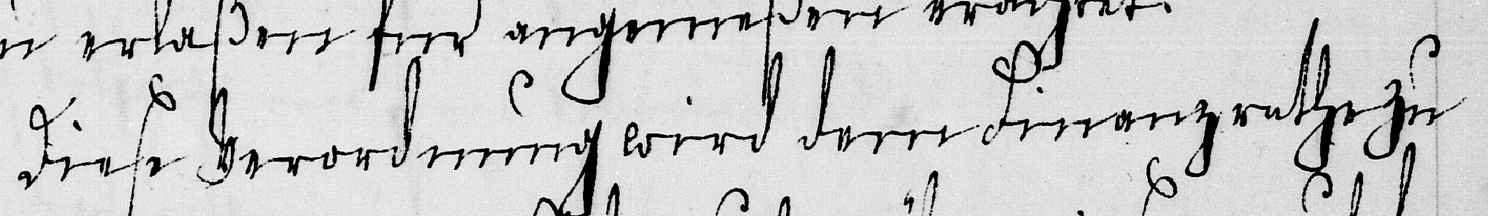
Diese Verordnung wird dem Finanzrathe zu
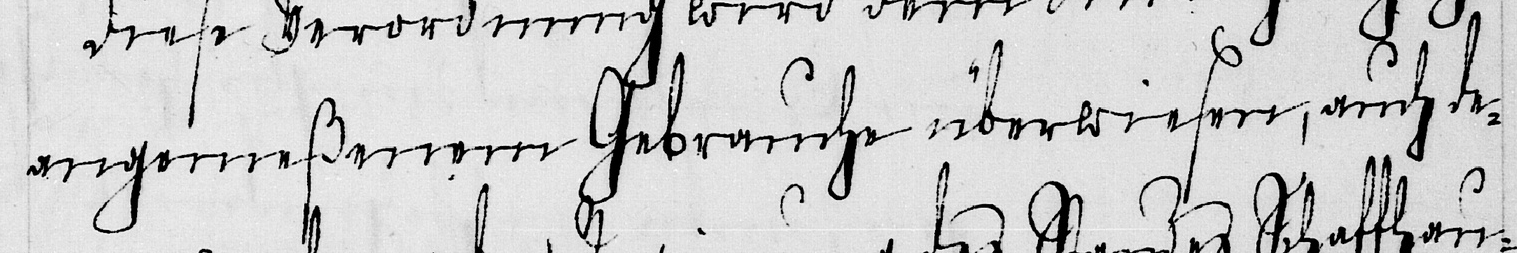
angemeßenen Gebrauche überwiesen, auch de¬
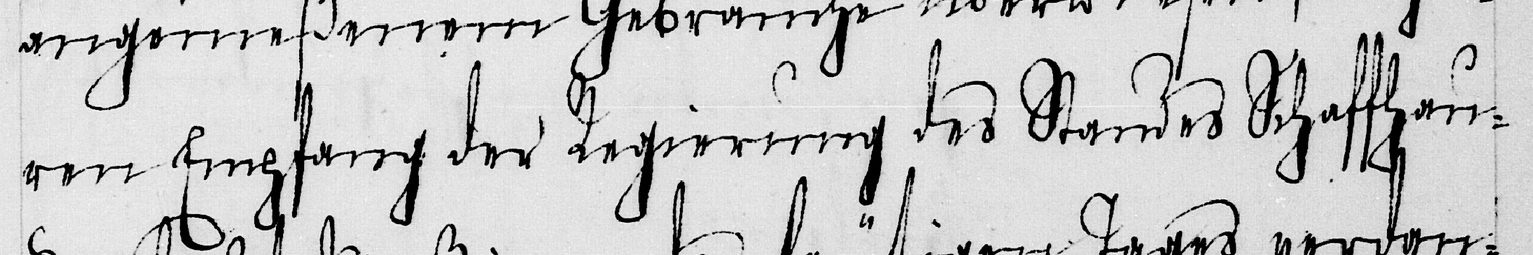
ren Empfang der Regierung des Standes Schaffhau¬
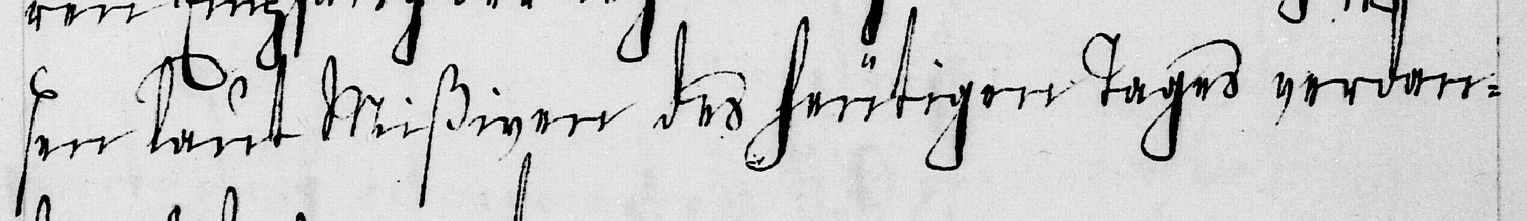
sen laut Mißiven des heutigen Tages verdan¬
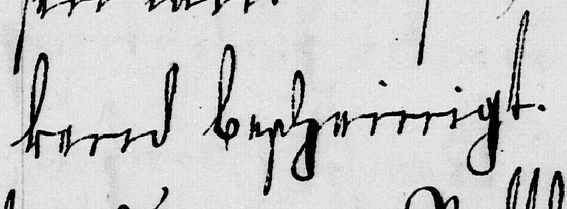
kend bescheinigt.
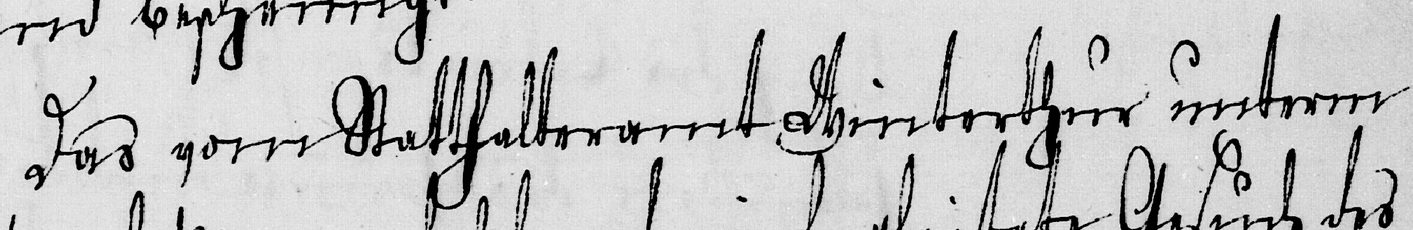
Das vom Statthalteramt Winterthur unterm
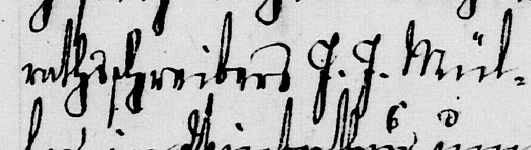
sschreiber J. J. Mül¬
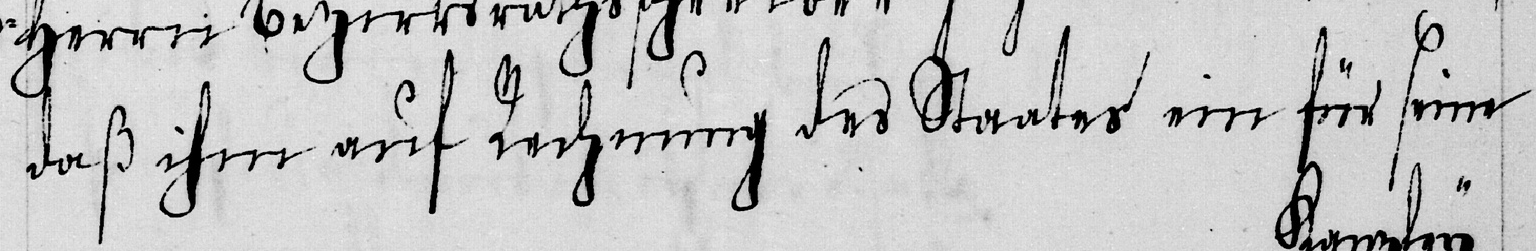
daß ihm auf Rechnung des Staates ein für seine
